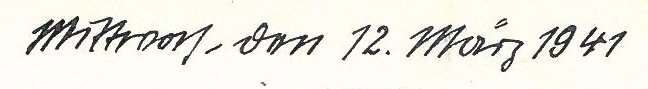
Mittwoch, den 12. März 1941
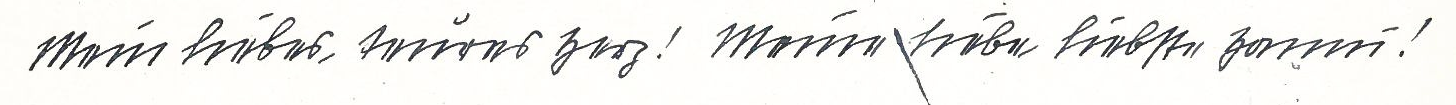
Mein liebes, teures Herz! Meine liebe, liebste !
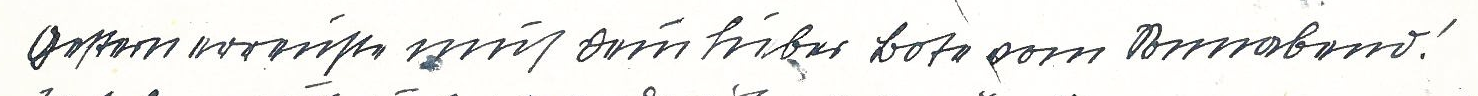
Gestern erreichte mich Dein lieber Bote vom Sonnabend!
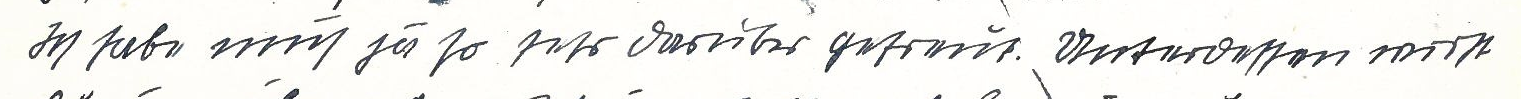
Ich habe mich ja so sehr darüber gefreut. Unterdessen wirst
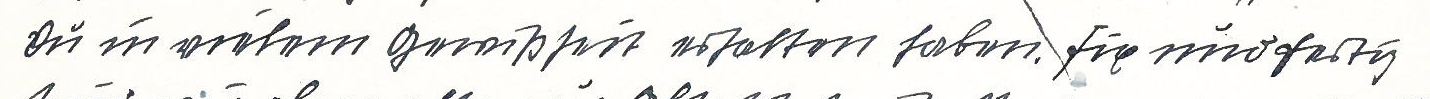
Du in vielem Gewissheit erhalten haben. Fix und fertig
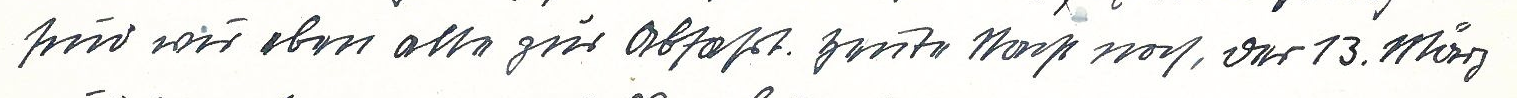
sind wir eben alle zur Abfahrt. Heute Nacht noch, der 13. März
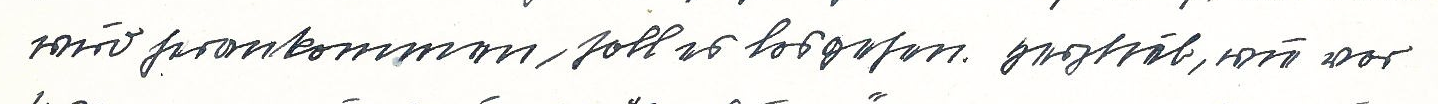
wird herankommen, soll es losgehen. Herzlieb, wie vor
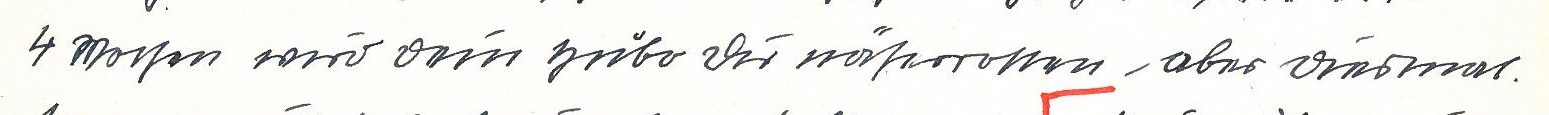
4 Wochen wird Dein Hubo Dir näherrollen, aber diesmal
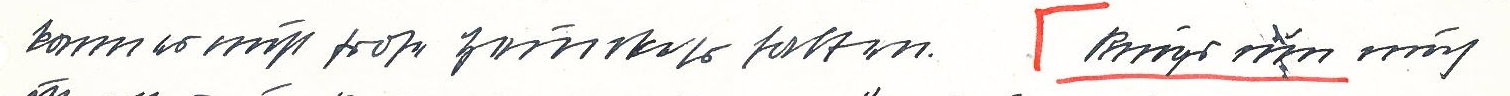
kann er nicht frohe Heimkehr halten. Rings um mich
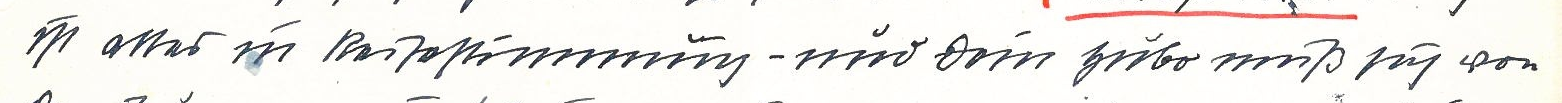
ist alles in Reisestimmung – und Dein Hubo muss sich von
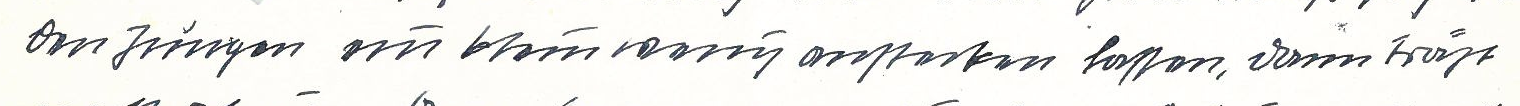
den Jungen ein klein wenig anstecken lassen, dann trägt
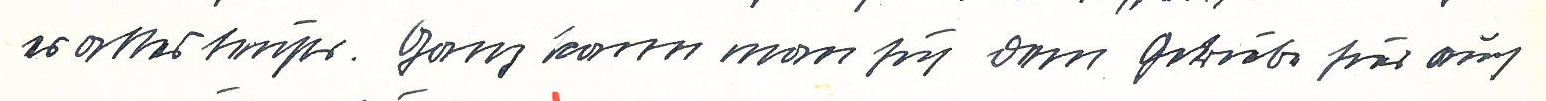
er alles leichter. Ganz kann man sich dem Getriebe hier auch
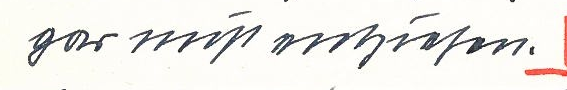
gar nicht entziehen.
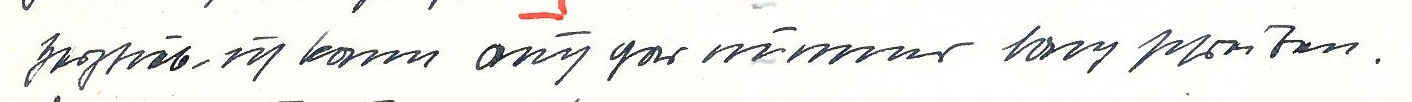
Herzlieb, ich kann auch gar nimmer lang schreiben.
